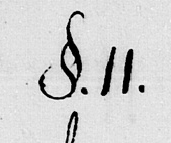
§. 11.
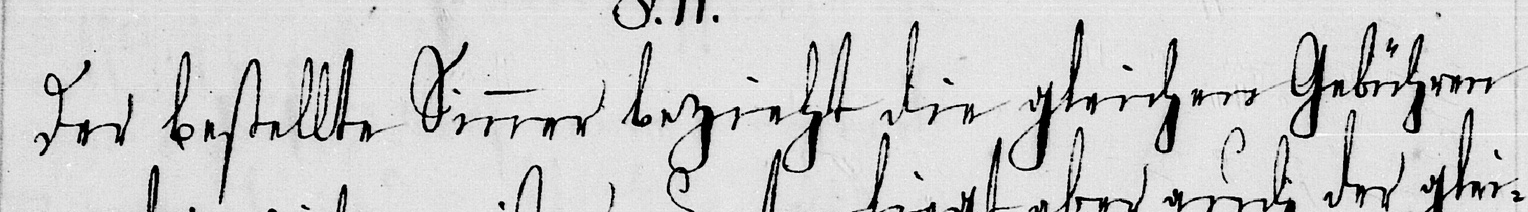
Der bestellte Sinner bezieht die gleichen Gebühren
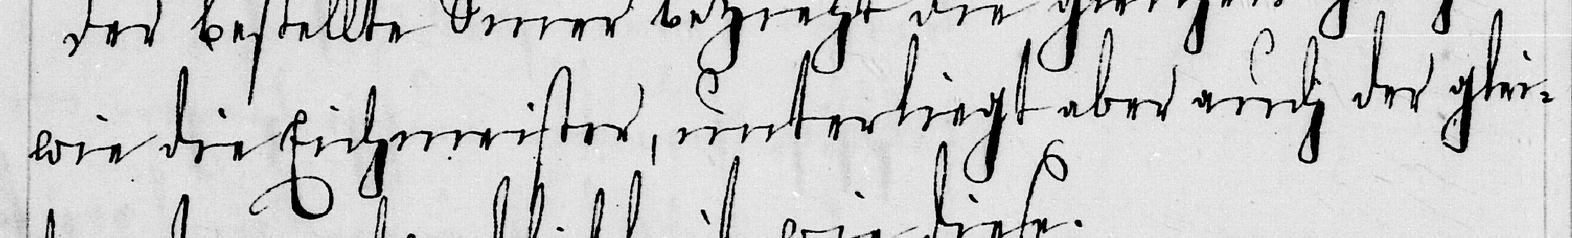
wie die Eichmeister, unterliegt aber auch der glei¬
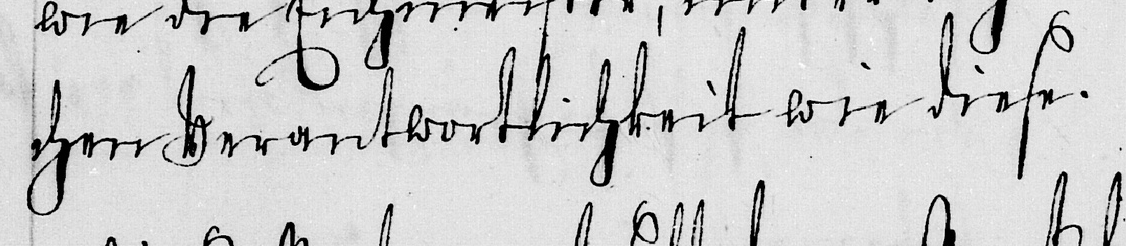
chen Verantwortlichkeit wie diese.
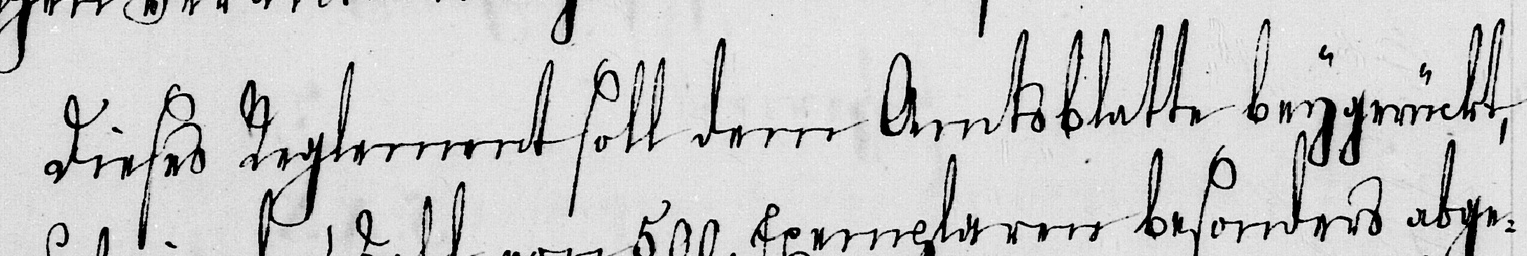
Dieses Reglement soll dem Amtsblatte beygerüc¬
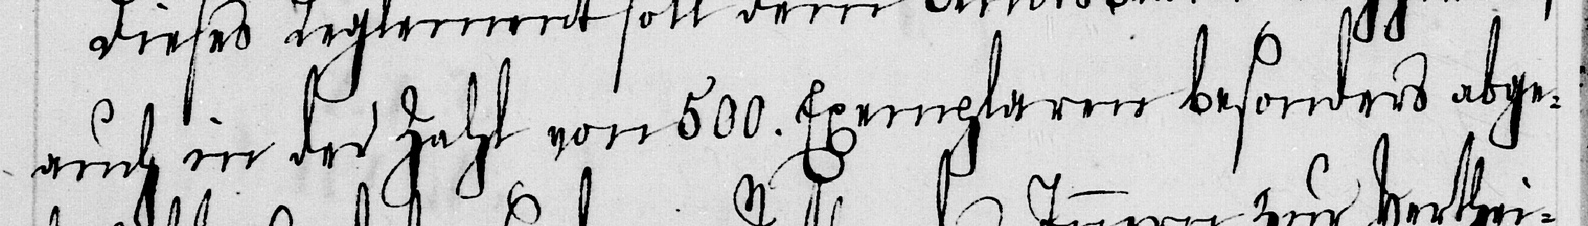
auch in der Zahl von 500. Exemplaren besonders abge¬
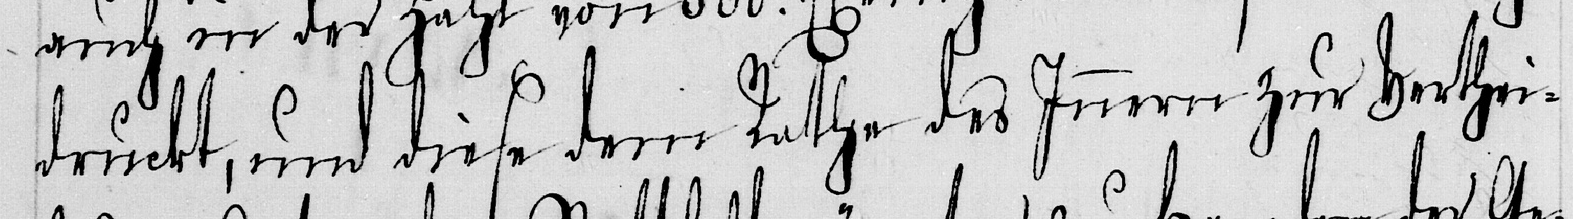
druckt, und diese dem Rathe des Innern zur Verthei¬
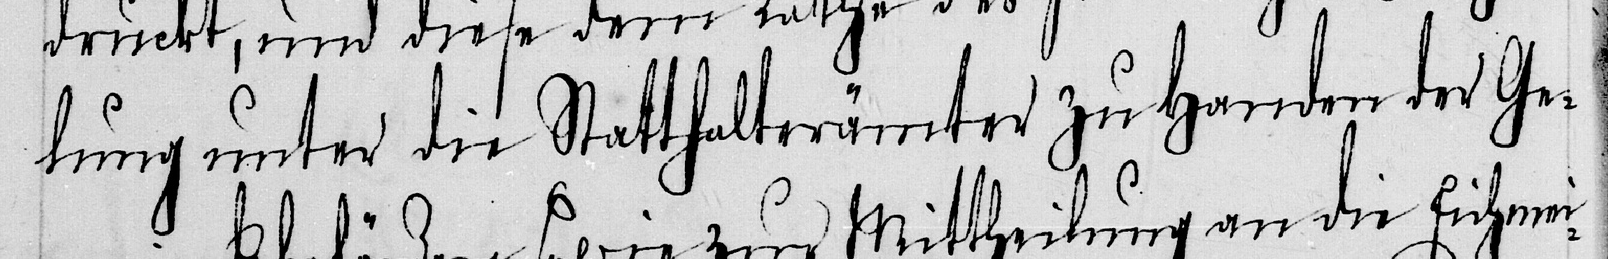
lung unter die Statthalterämter zu Handen der Ge¬
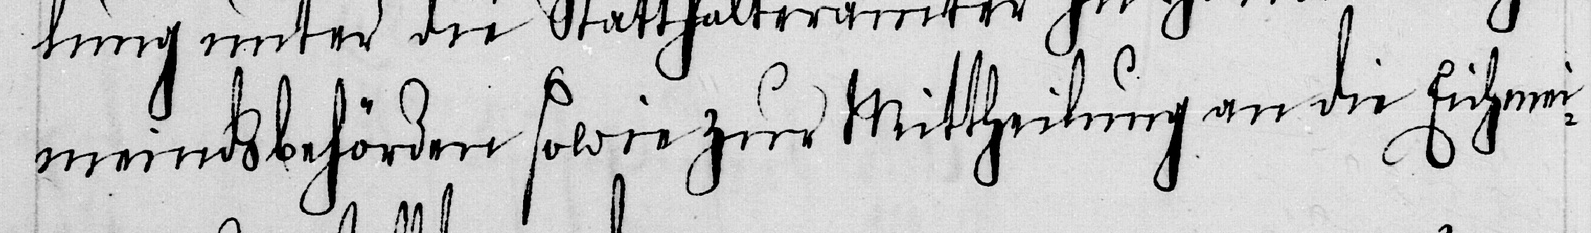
meindsbehörden sowie zur Mittheilung an die Eichmei¬
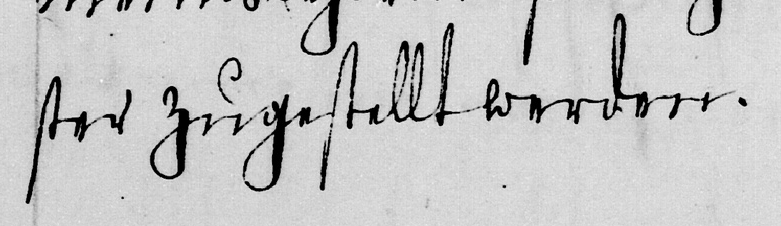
ster zugestellt werden.
